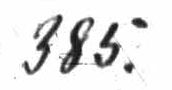385.
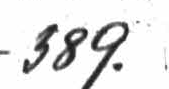389.
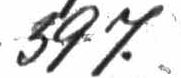397.
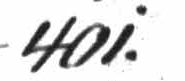401.
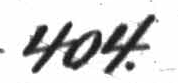404.
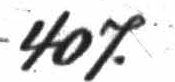407.
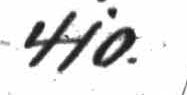410.
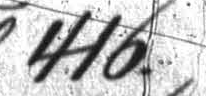416.
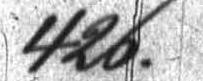426.
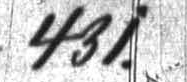431.
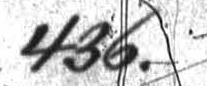436.
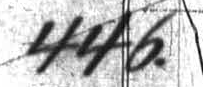446.
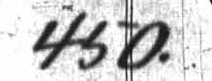450.
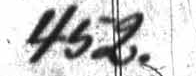452.
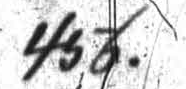456.
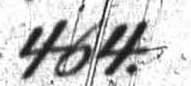464.
